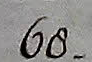68
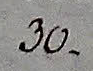30
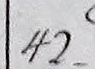42
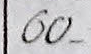60
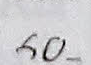50
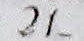21
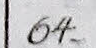64
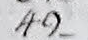49
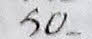50
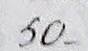50
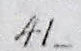41
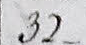32
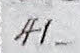41
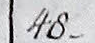48
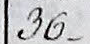36
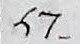57
